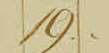19.
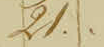21.
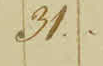31.
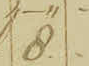8.
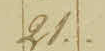21.
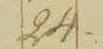24
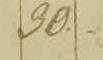30.
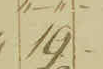19.
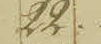22
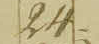24
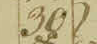30
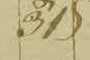31
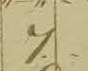7.
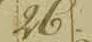26
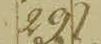29
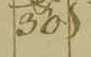30
